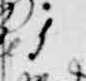1
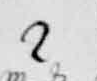2
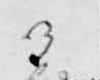3
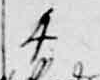4
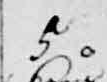5
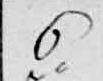6
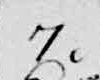7
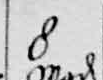8
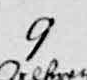9
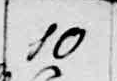10
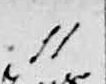11
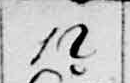12
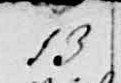13
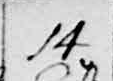14
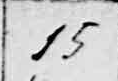15
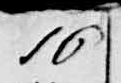16
